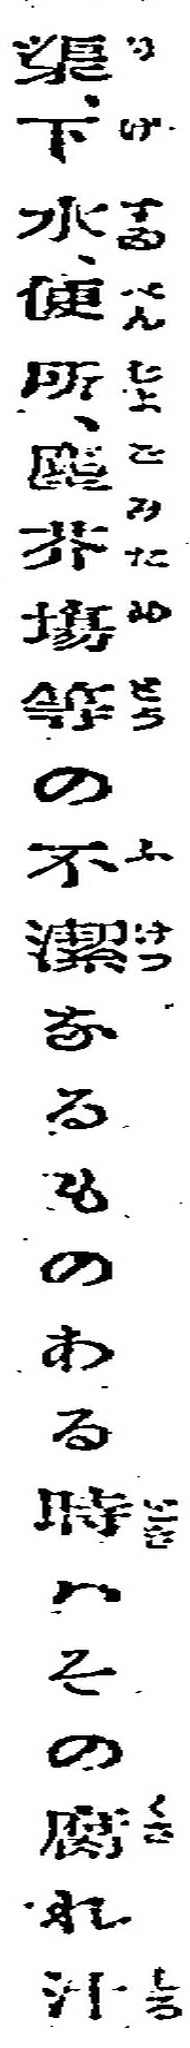渠、下水、便所、塵芥場等の不潔なるっものある時はその腐れ汁
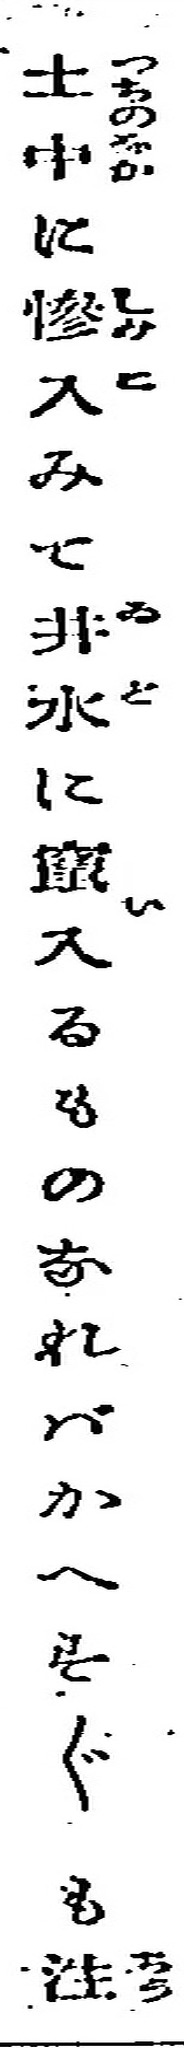土中に惨入みて井水に竄入るものなればかへす〴〵も注
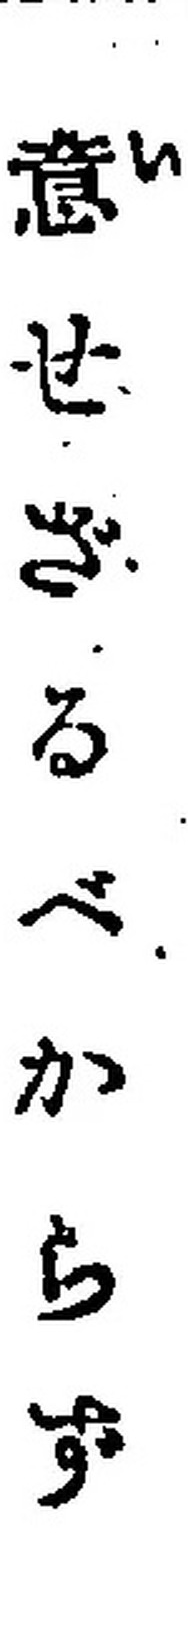意せざるべからず
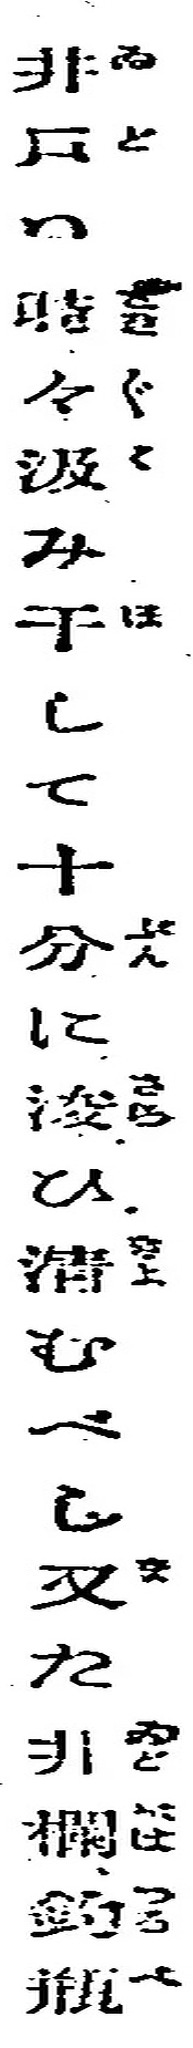井戸は時々汲み干して十分に浚ひ清むべし又た井欄、釣瓶

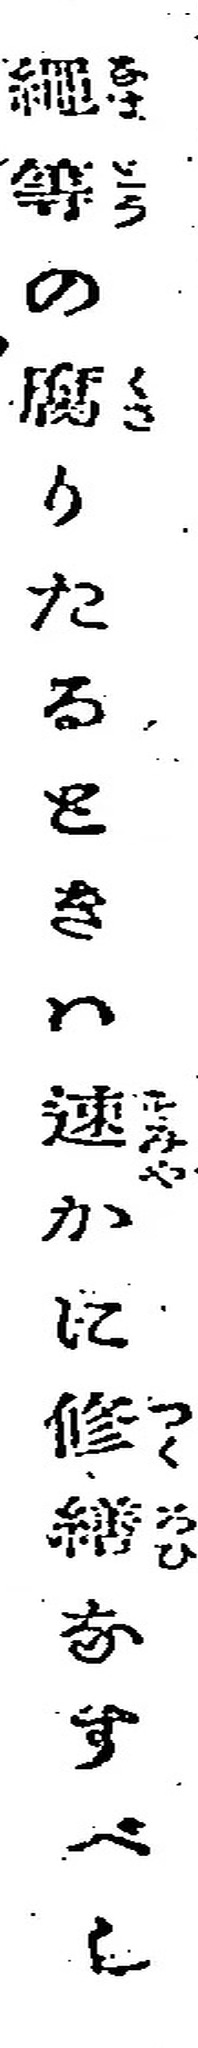縄等の腐りたるときは速かに修繕なすべし
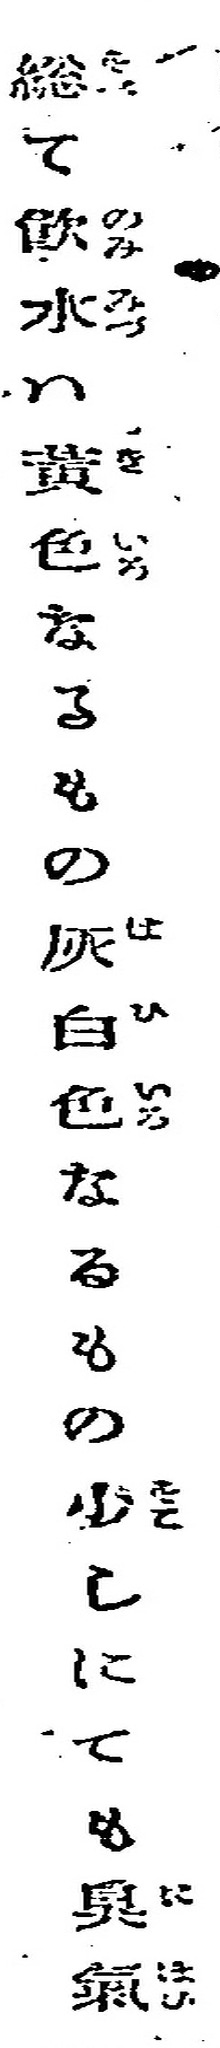総て飲水は黄色なるもの灰白色なるもの少しにても臭気
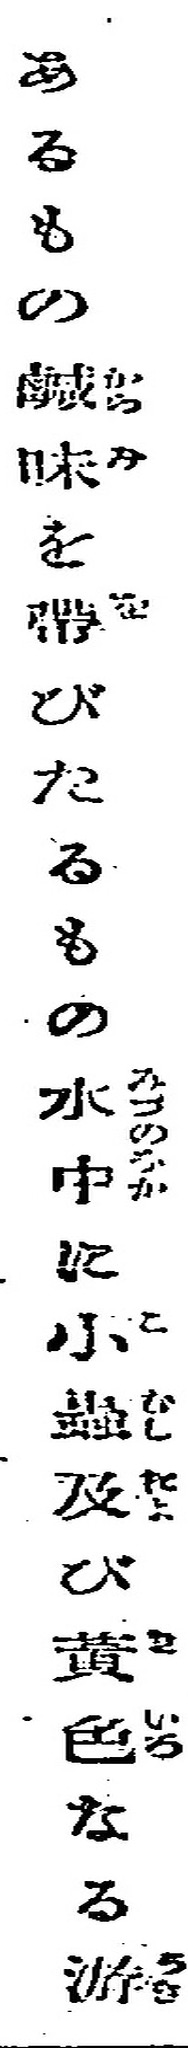あるもの鹹味を帯びたるもの水中に小蟲及び黄色なる游
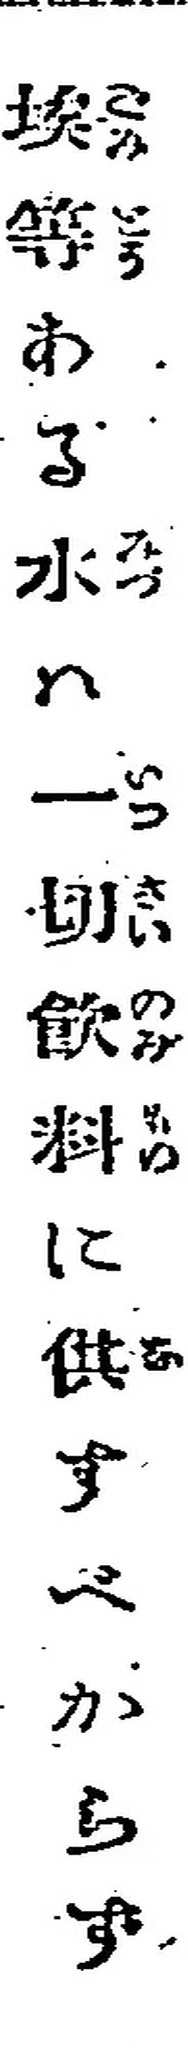埃等ある水は一切飲料に供すべからず
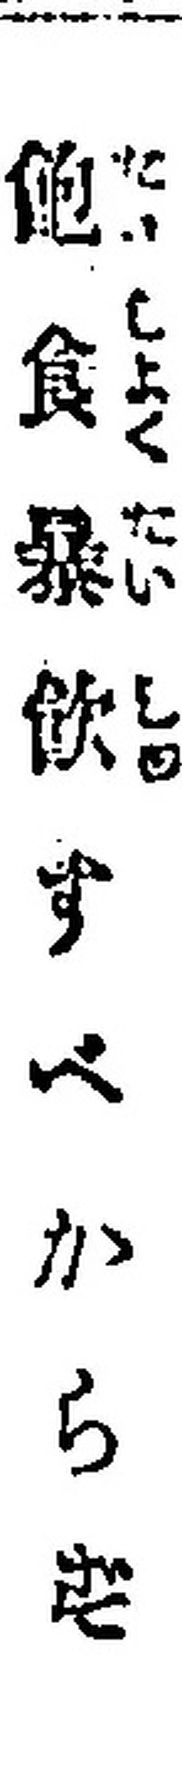飽食暴飲すべからず
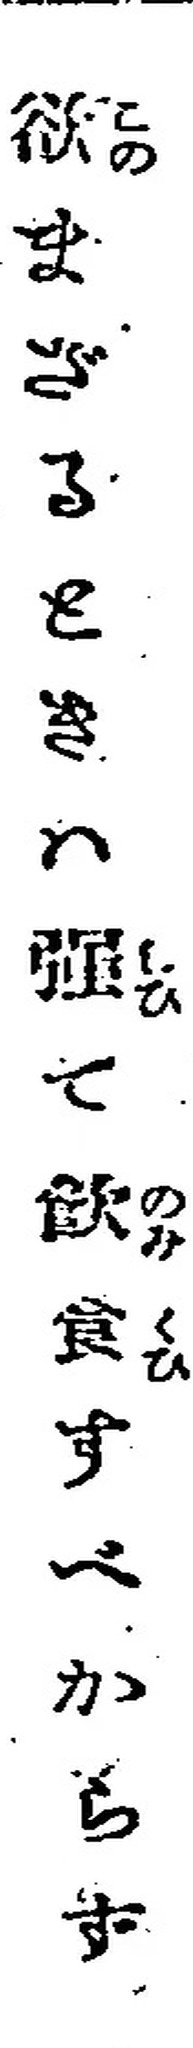欲まざるときは強て飲食すべからず
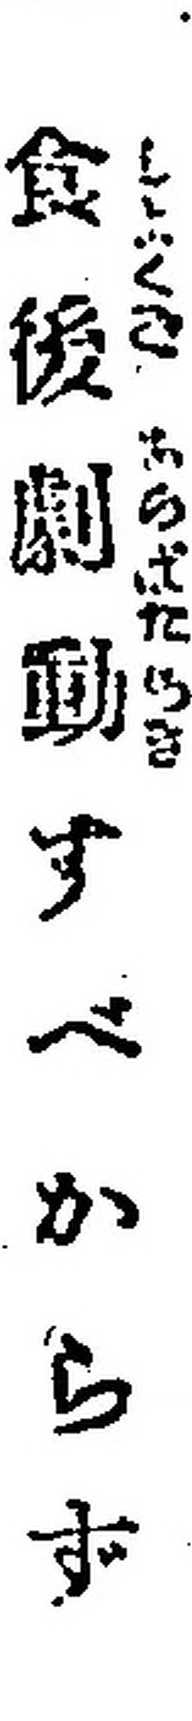食後劇動すべからず
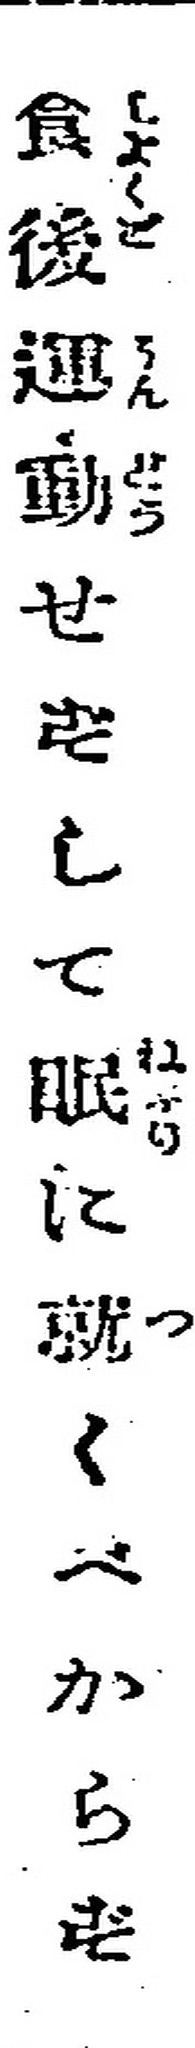食後運動せずして眠に就くべからず
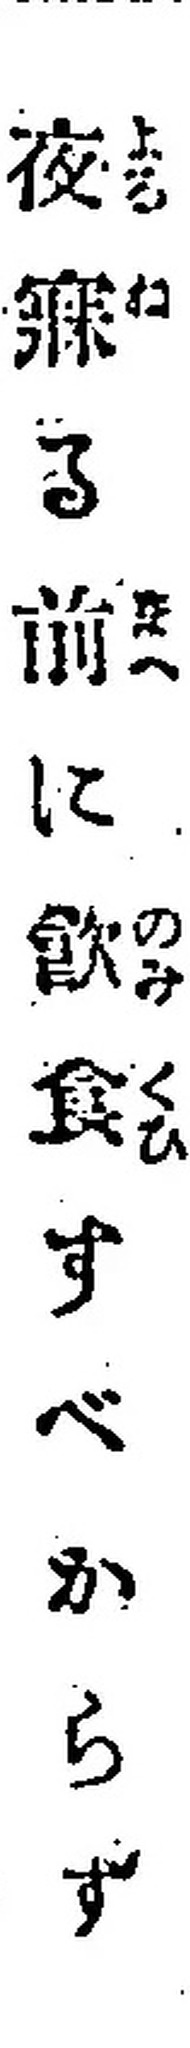夜寝る前に飲食すべからず
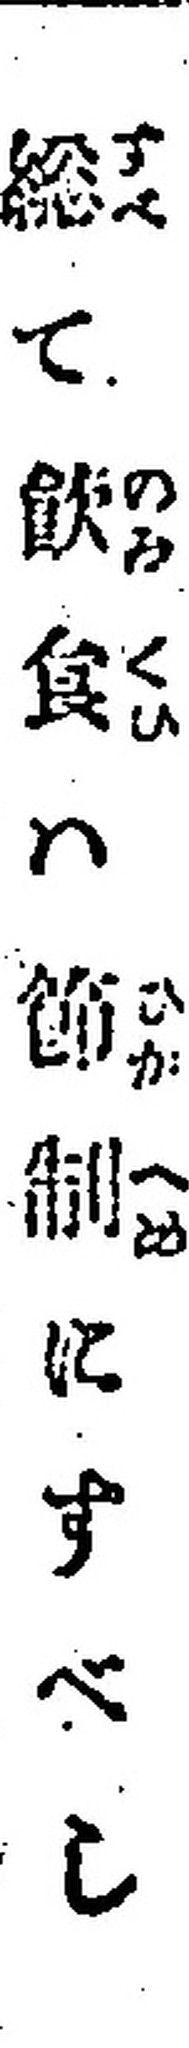総て飲食は節制にすべし
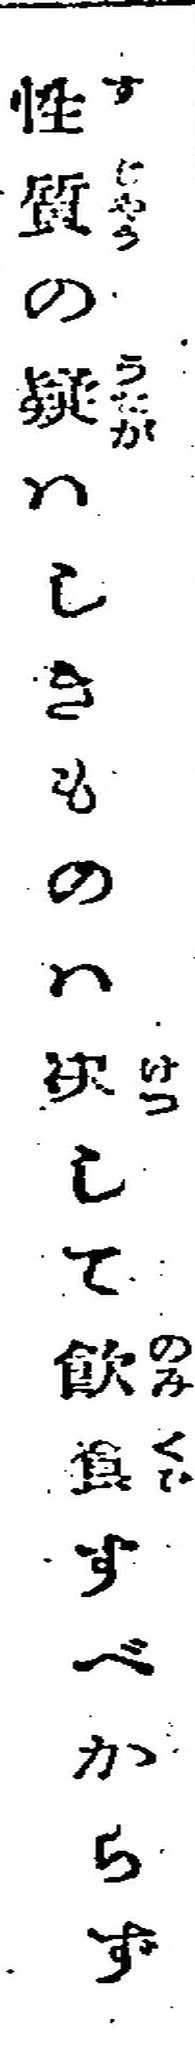性質の疑はしきものは決して飲食すべからず
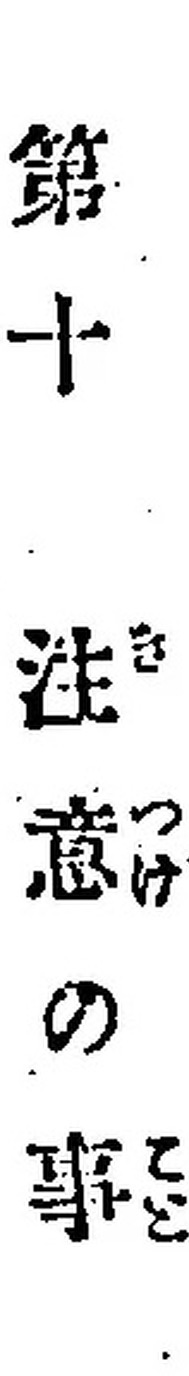第十注意の事
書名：新撰暑中養生法 : 附・コレラ予防歌
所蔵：国立国会図書館 National Diet Library, JAPAN
